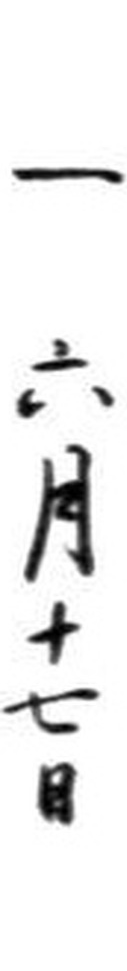一六月十七日
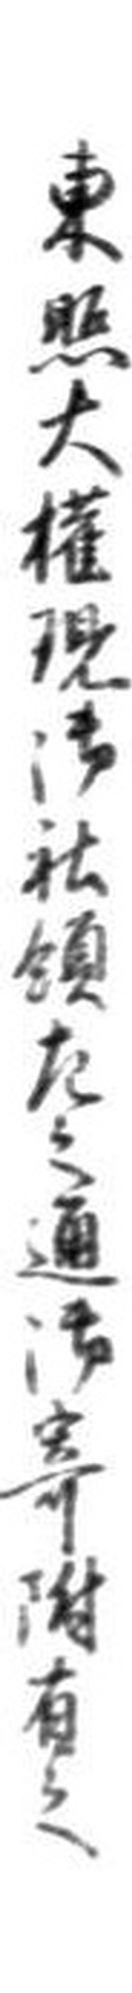東照大権現御社領左之通御寄附有之
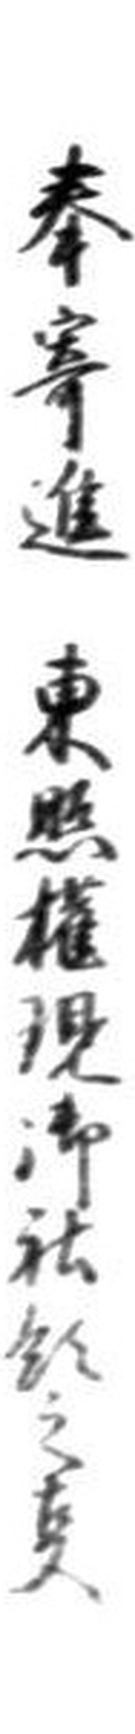奉寄進東照権現御社領之事
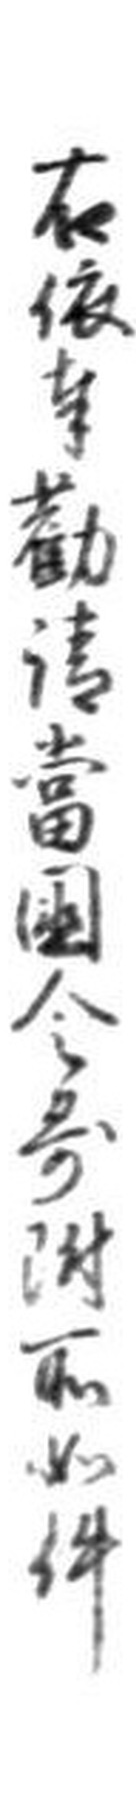右依奉勧請当国令寄附所如件
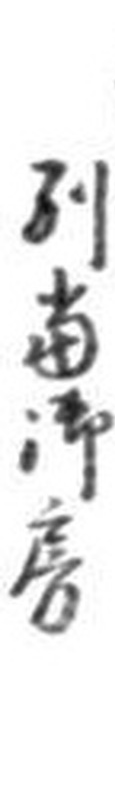別當御房

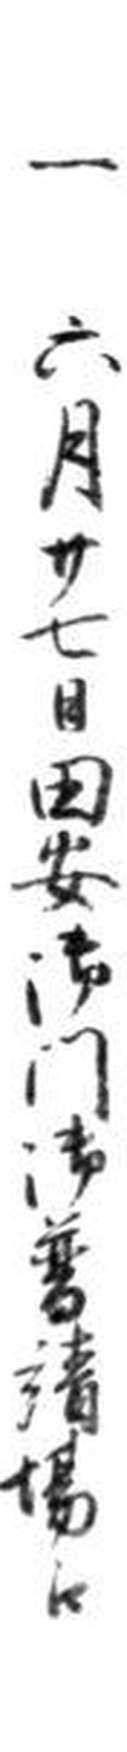一六月廿七日田安御門御普請場江
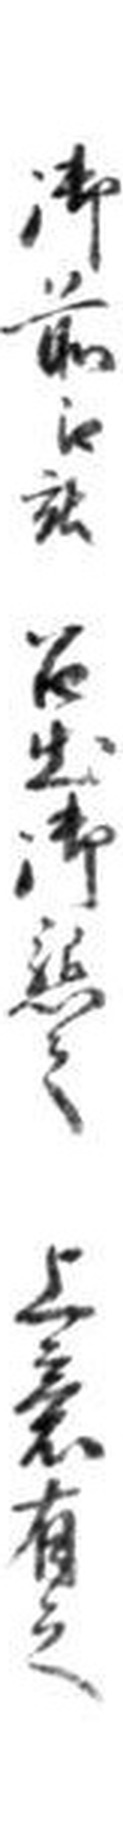御前江被召出御懇之上意有之
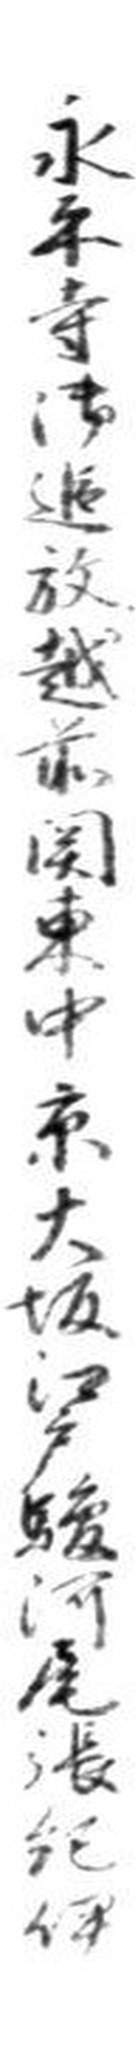永平寺御追放越前関東中京大坂江戸駿河尾張紀伊
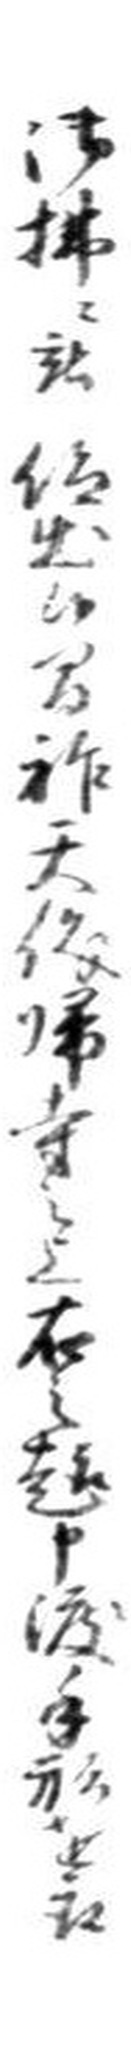御払ニ被仰出候間祚天儀帰寺之上右之趣申渡手形を取
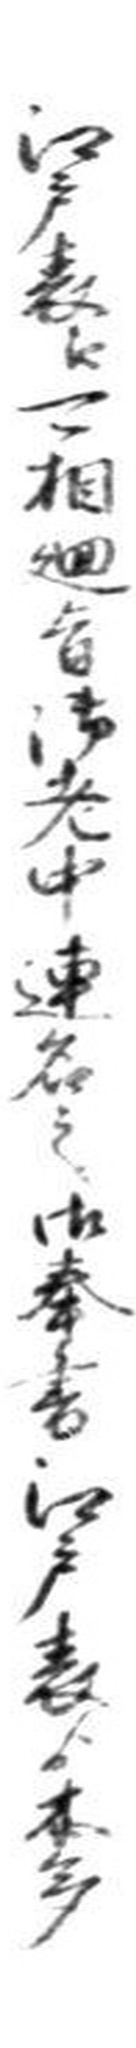江戸表江可相廻旨御老中連名之御奉書江戸表ゟ本多
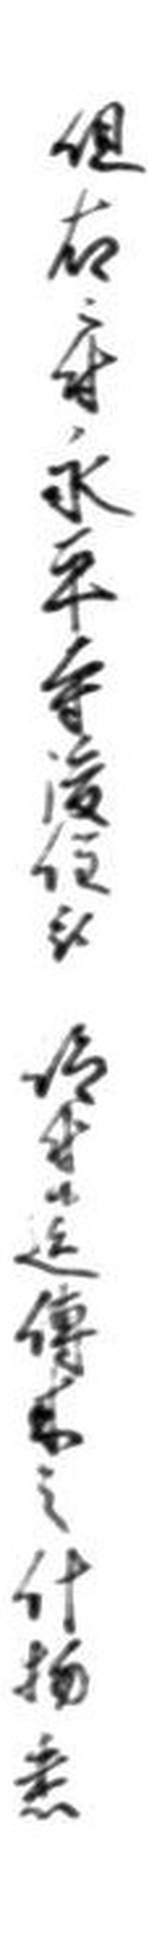但右ニ付永平寺後住被仰付候迄伝来之什物悉
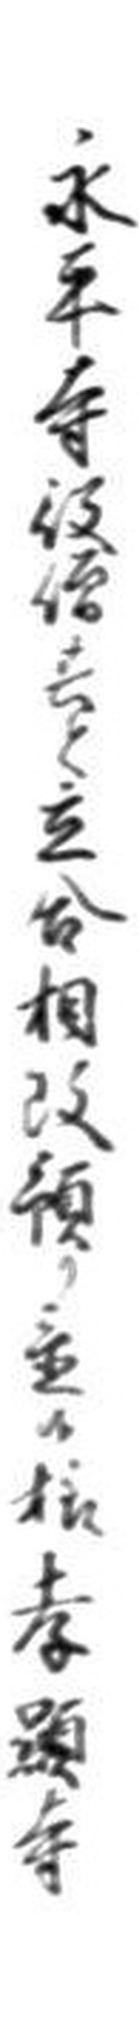永平寺役僧共と立合相改預り置候様孝顕寺
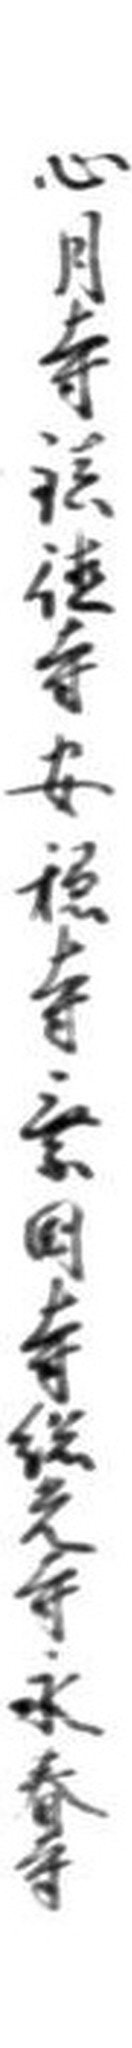心月寺鎮徳寺安穏寺乗国寺総光寺永春寺
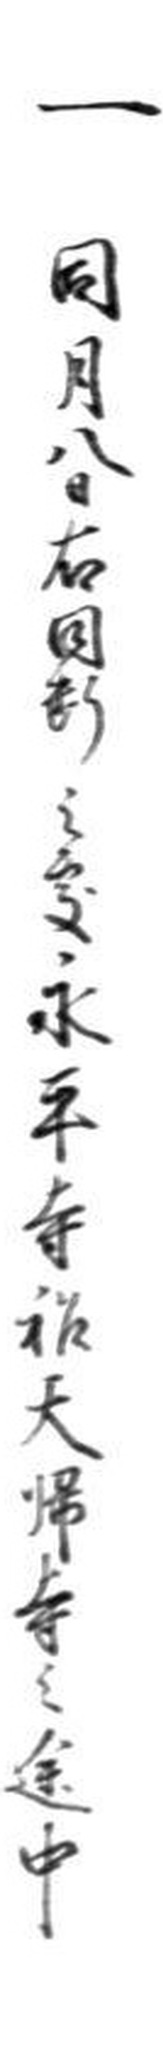一同月八日右同断之処永平寺祚天帰寺之途中
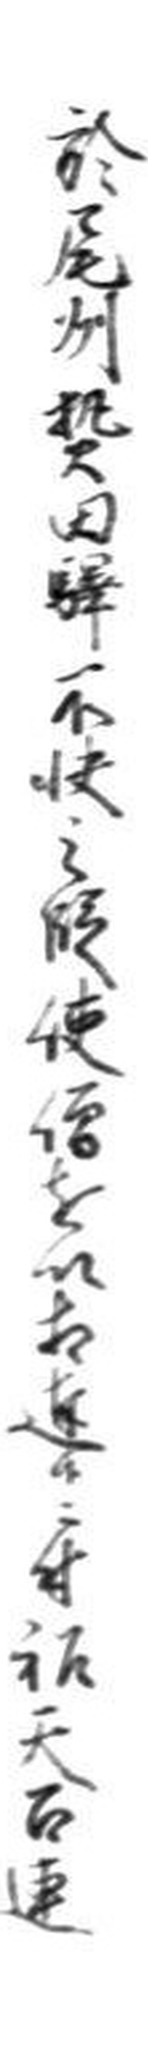於尾州熱田駅不快之段使僧を以相達候ニ付祚天召連
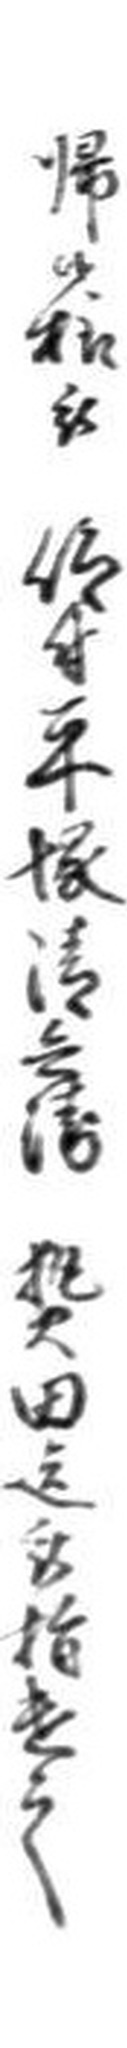帰候様被仰付平塚清兵衛熱田迄被指遣之
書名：家譜 三 忠昌公 従慶長八年到寛永六年
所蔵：福井県文書館 Fukui Prefectural Archives
